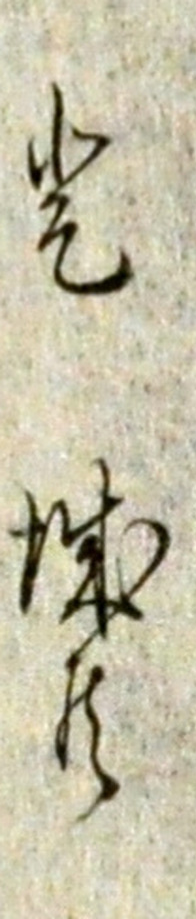登城候
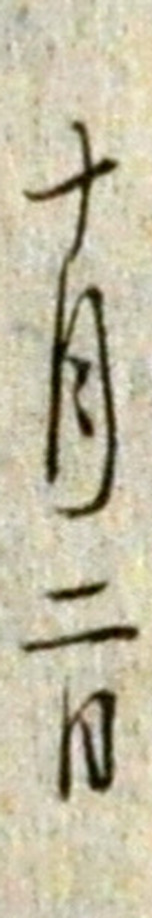十月二日
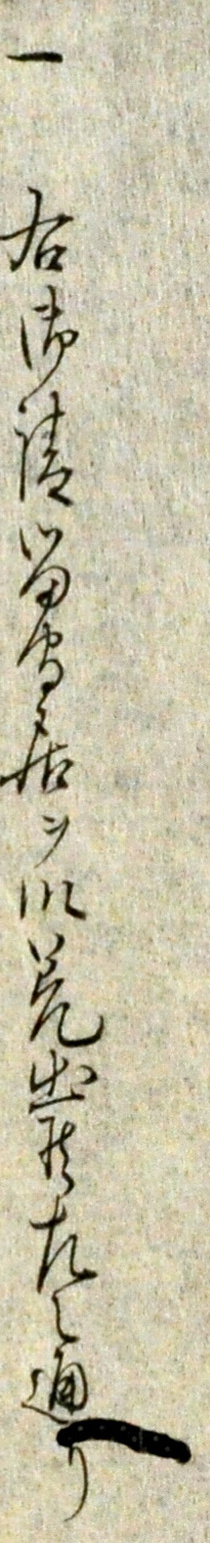一右御請留守居ヲ以差出候左之通り
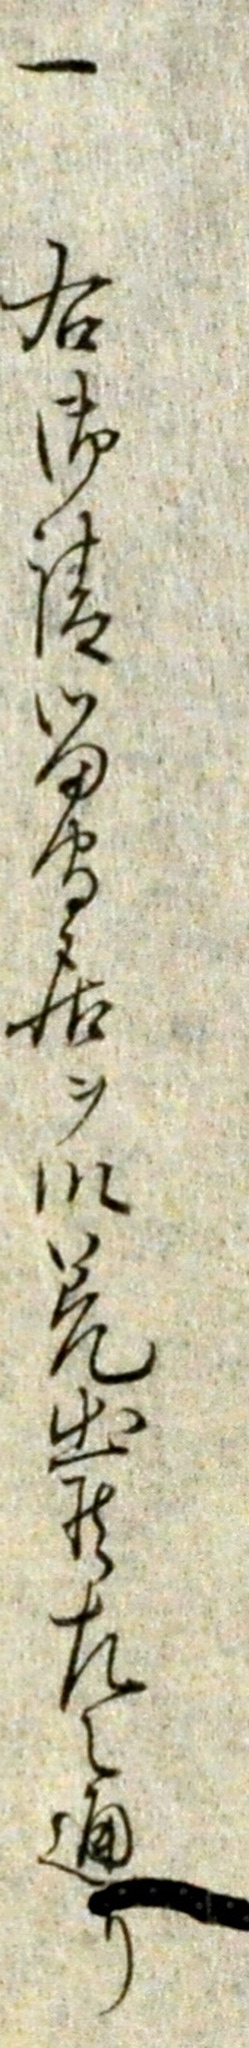一右御請留守居ヲ以差出候左之通り
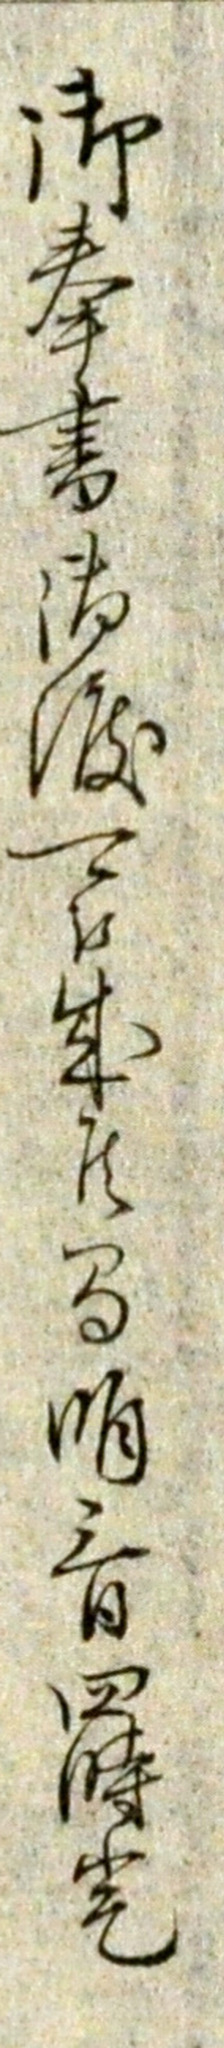後奉書御渡可被成候間明三日四時登
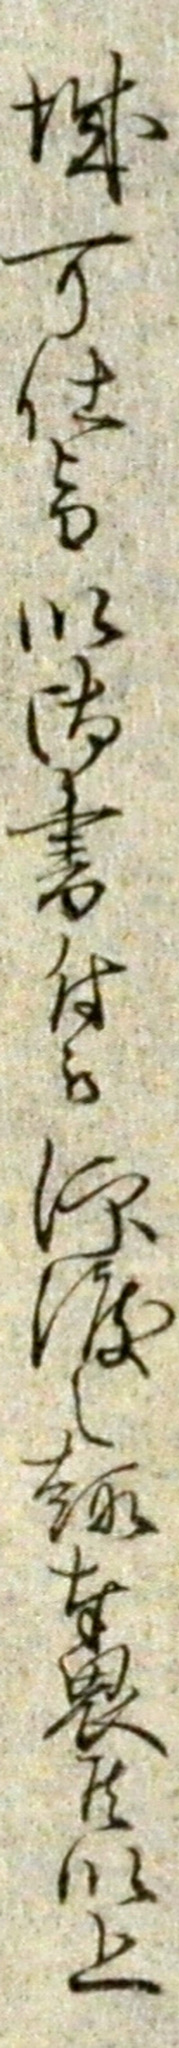城可仕旨以御書付被仰渡之趣奉畏候以上
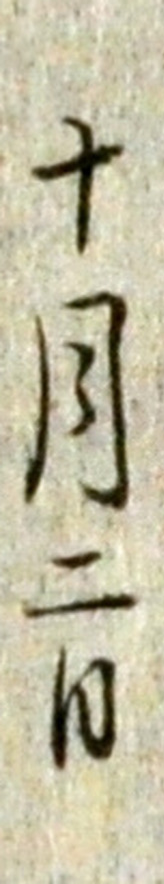十月二日
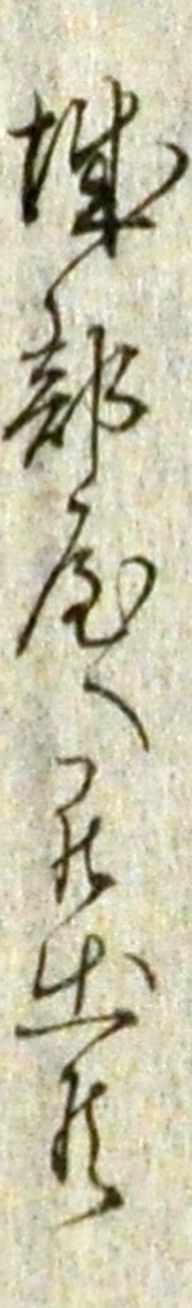城部屋へ罷出候
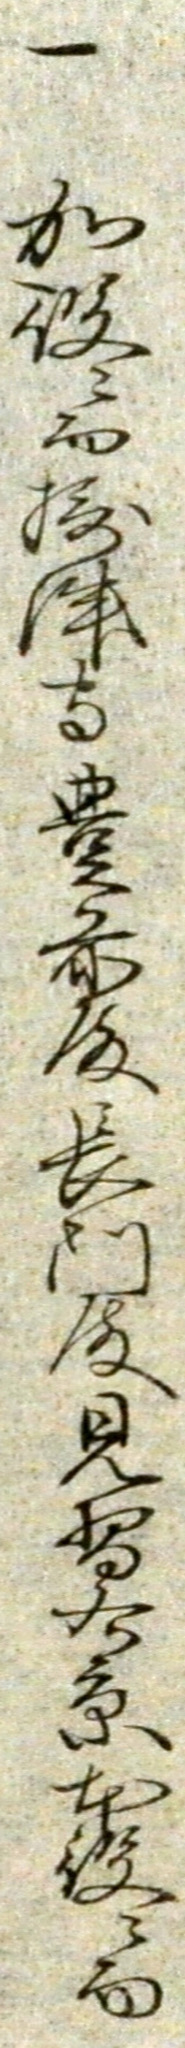一加役ニ而攝津守豊前殿長門殿見習右京本役ニ而
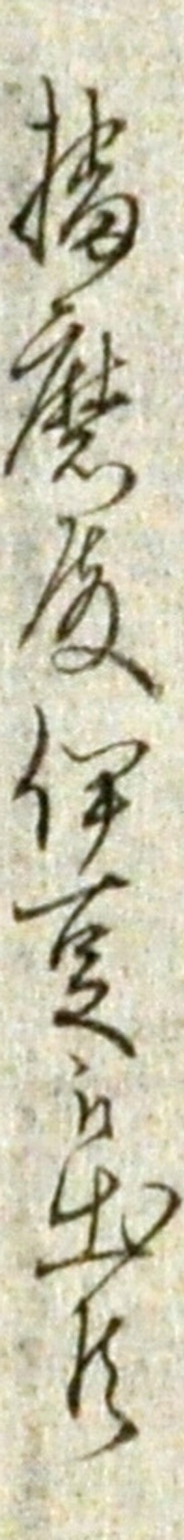播磨殿伊豆被出候
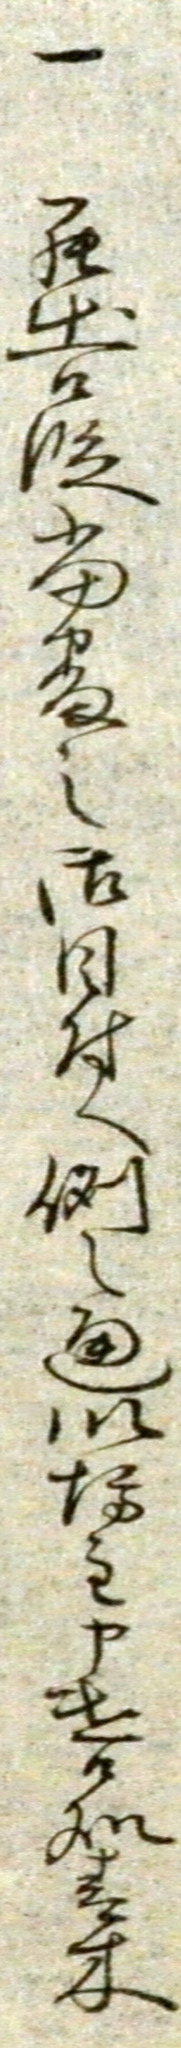一罷出候段当番之御目付へ例之通以坊主申遣候処青木
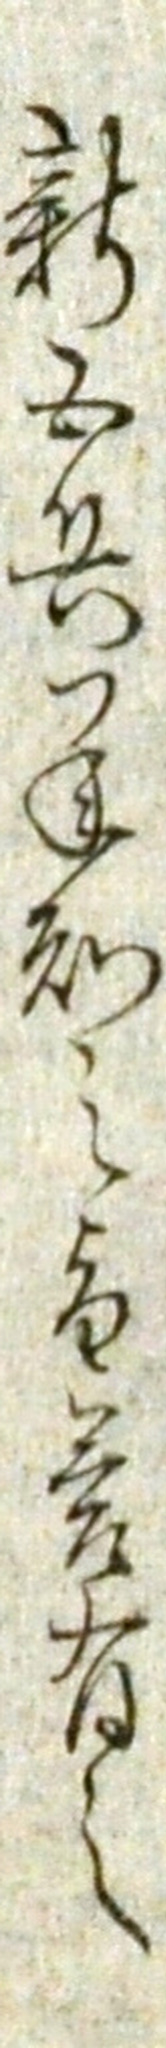新五兵承知之旨答有之
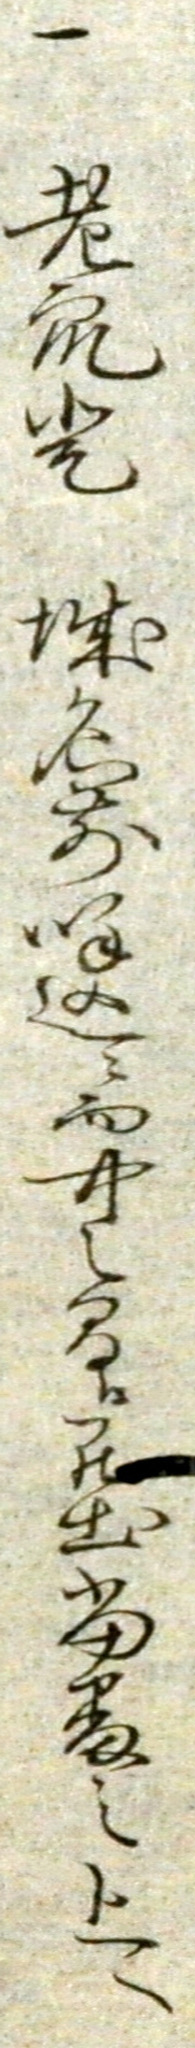一老衆登城名前呼込ニ而中之間江罷出当番之上へ
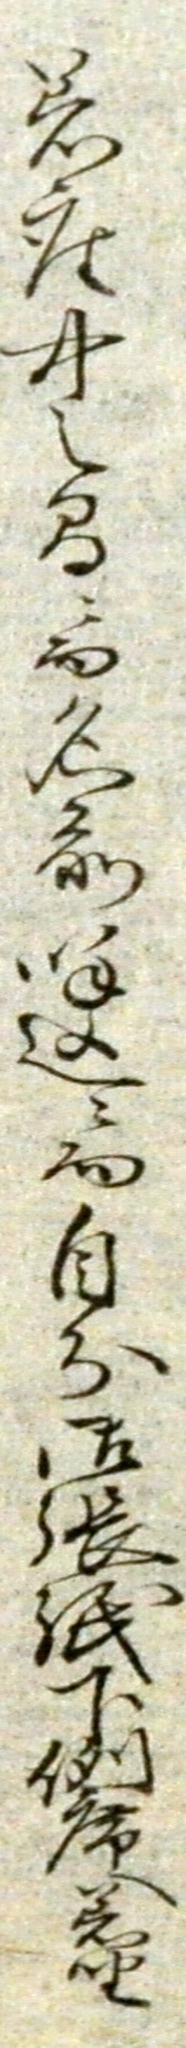着座中之間ニ而名前呼込ニ而自分御張紙下例席へ着座

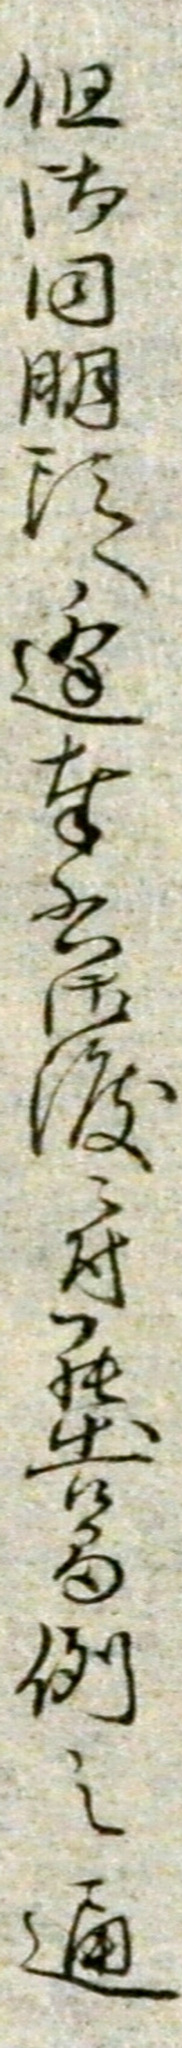但御同朋頭へ逢奉書御渡ニ付罷出候間例之通
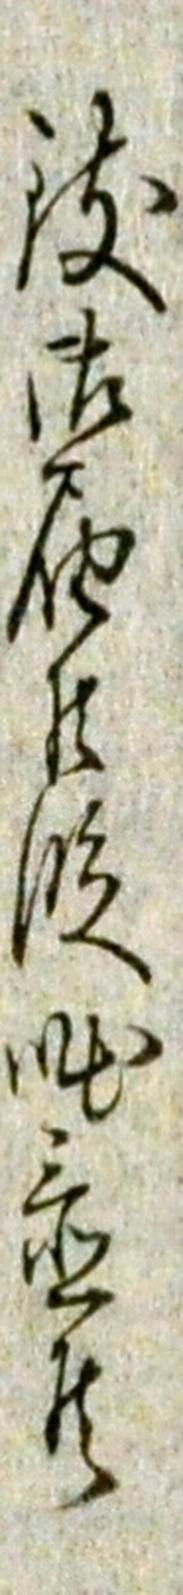致御届候段咄置候
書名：日光御名代相勤候節ノ留
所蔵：伊那市立高遠町図書館・合同会社AMANE
